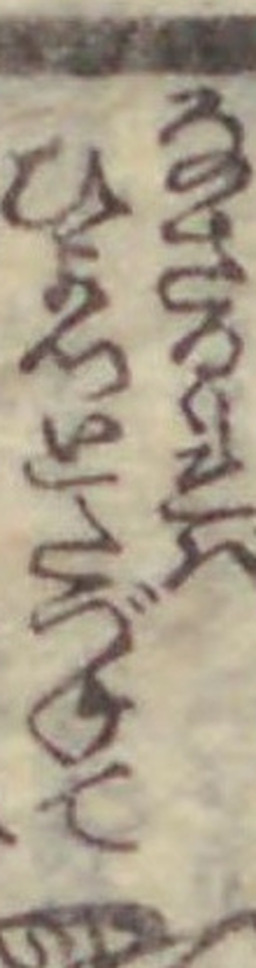ひよつとたづねて
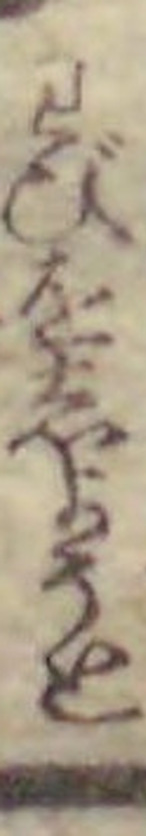わびをしようと
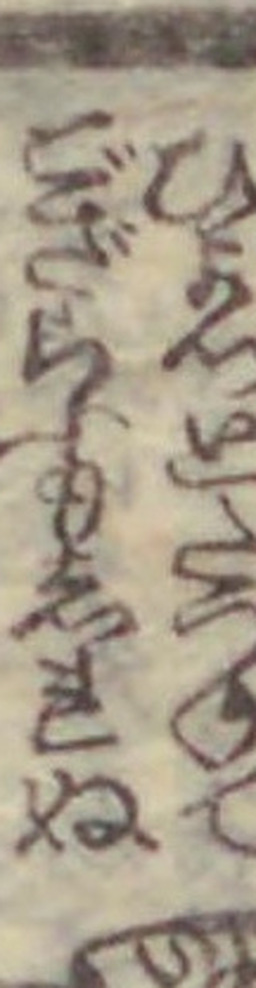ござらふもしれぬ
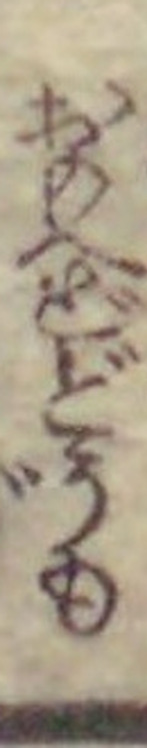おもへどどうも
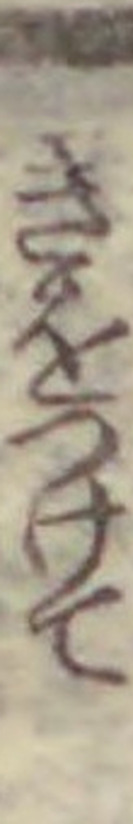きをつけて
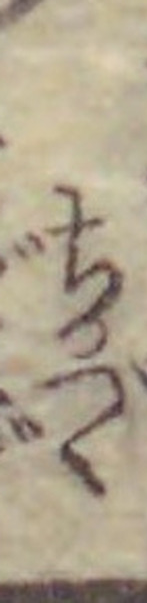ちかづく
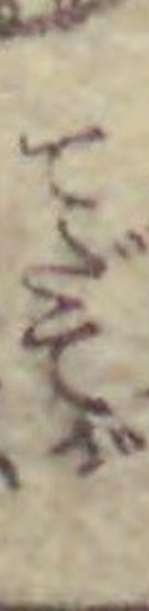てだてが
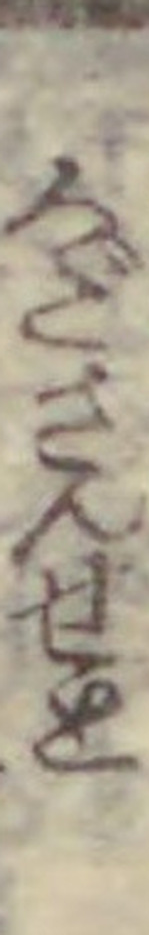くださんせと
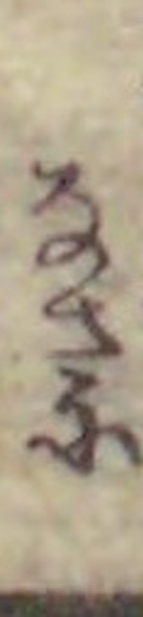なさに
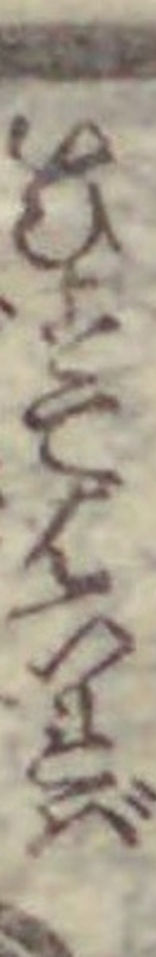いひすてはいれば
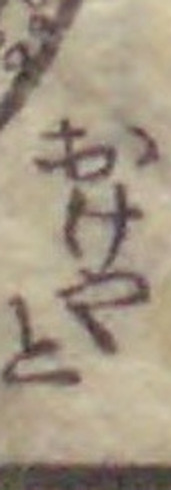おけやと
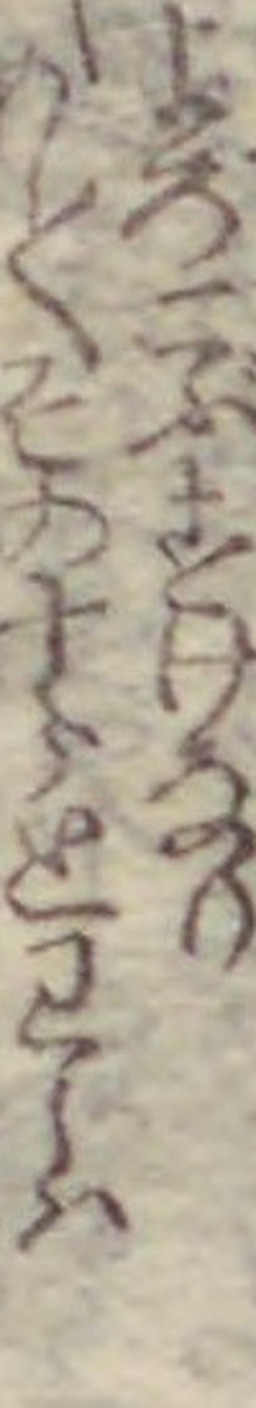〽もし〳〵その十郎とわしは
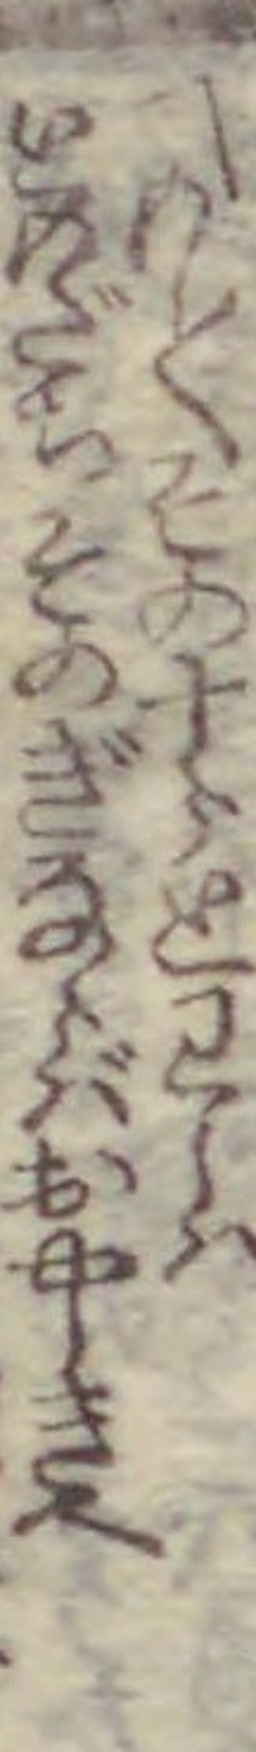ともだちそのぎならばおやしきへ
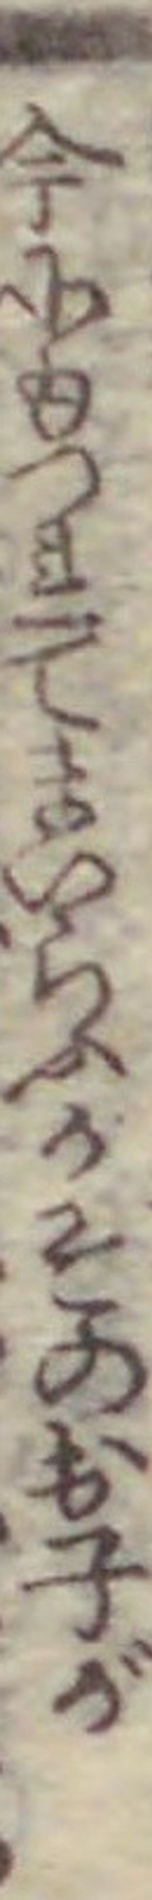今にもつれてまいらふかそのお子が
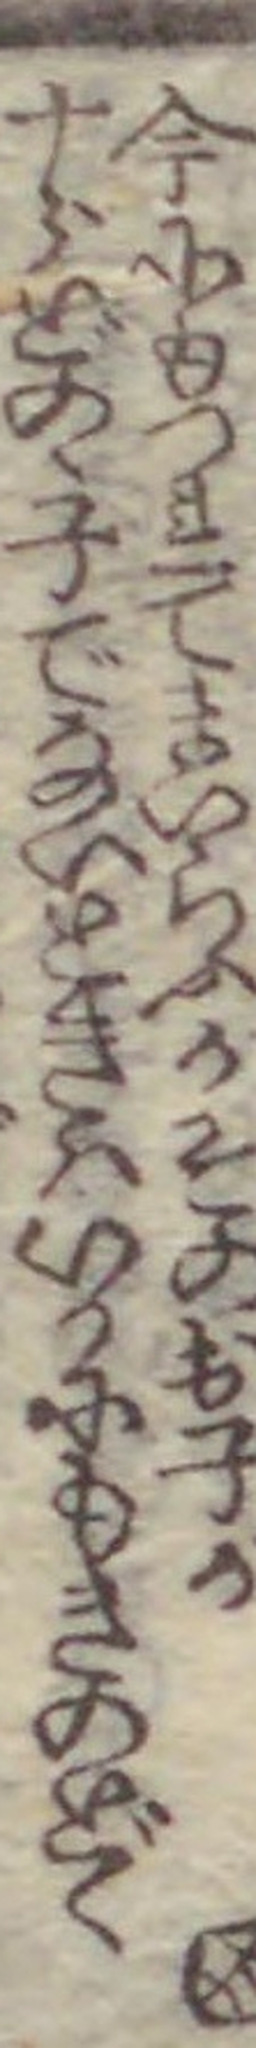十郎どのゝ子でないときはいかにもきのどく
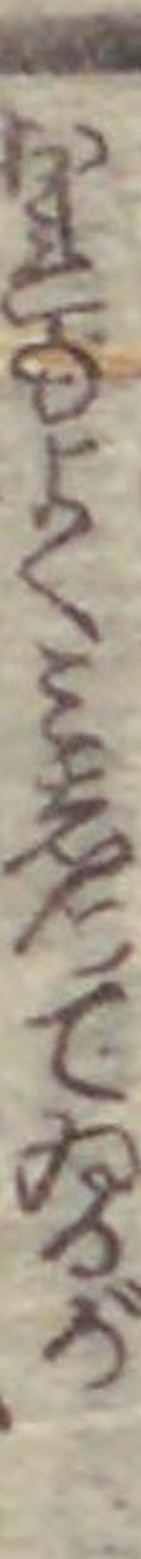おれもよくみしつてゐるが
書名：大時代唐土化物 3巻. 曽我太夫染
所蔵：国立国会図書館 National Diet Library, JAPAN
